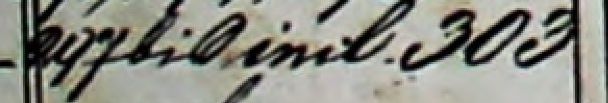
297 bis incl. 303
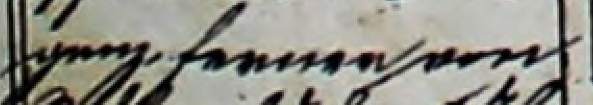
ganz ferner von
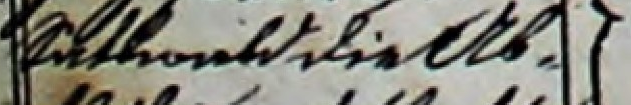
Satlwald die Ab„
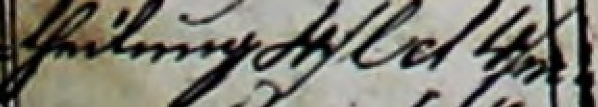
theilung 4/l et 4/m
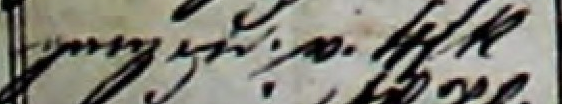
ganz zu v. 4/k
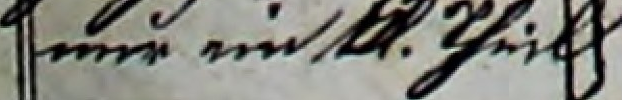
nur ein kl. Theil
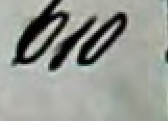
610
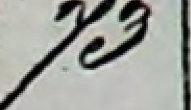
73
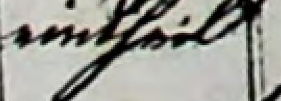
ein Theil
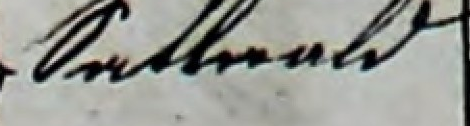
Sattwald
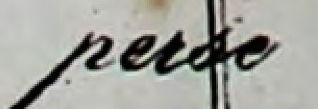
perse
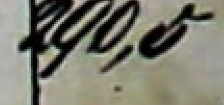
290,5
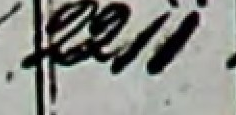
2211
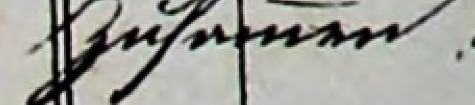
Zusammen
